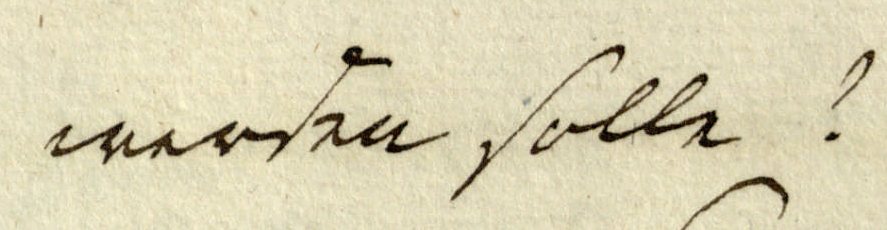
werden solle?
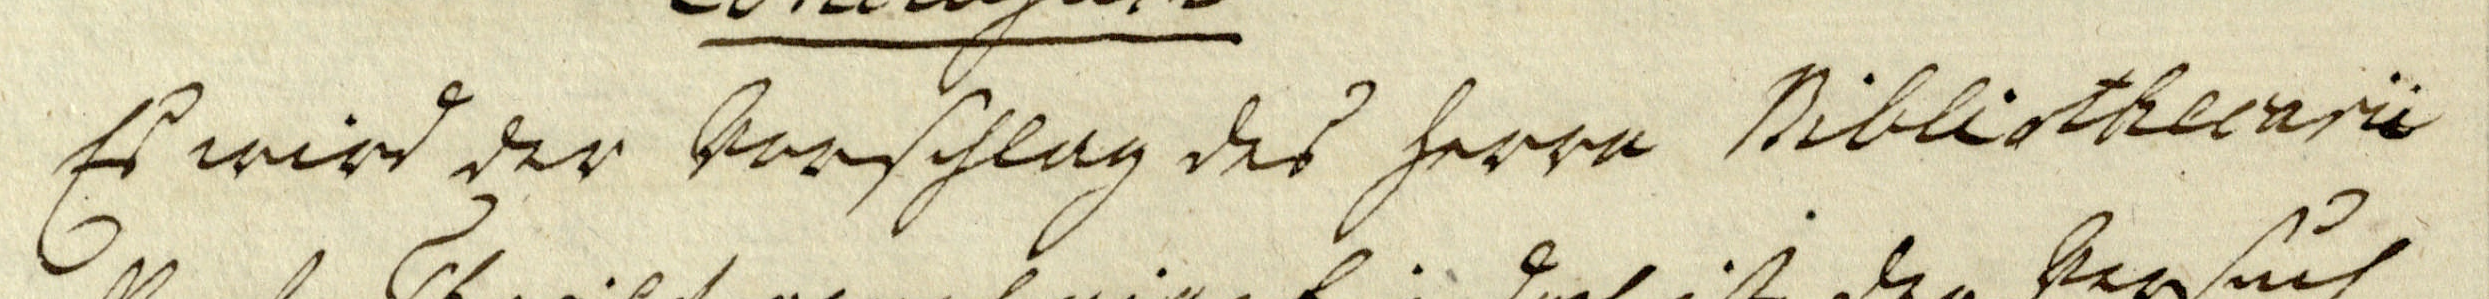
Es wird der Vorschlag des Herrn Bibliothecarii
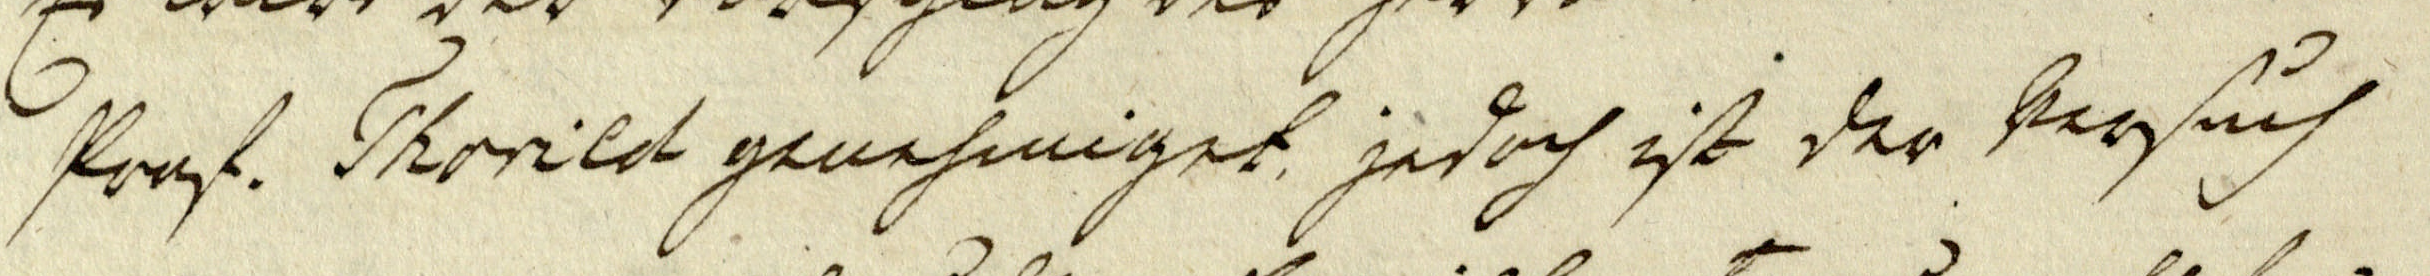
Prof. Thorild genehmiget, jedoch ist der Versuch
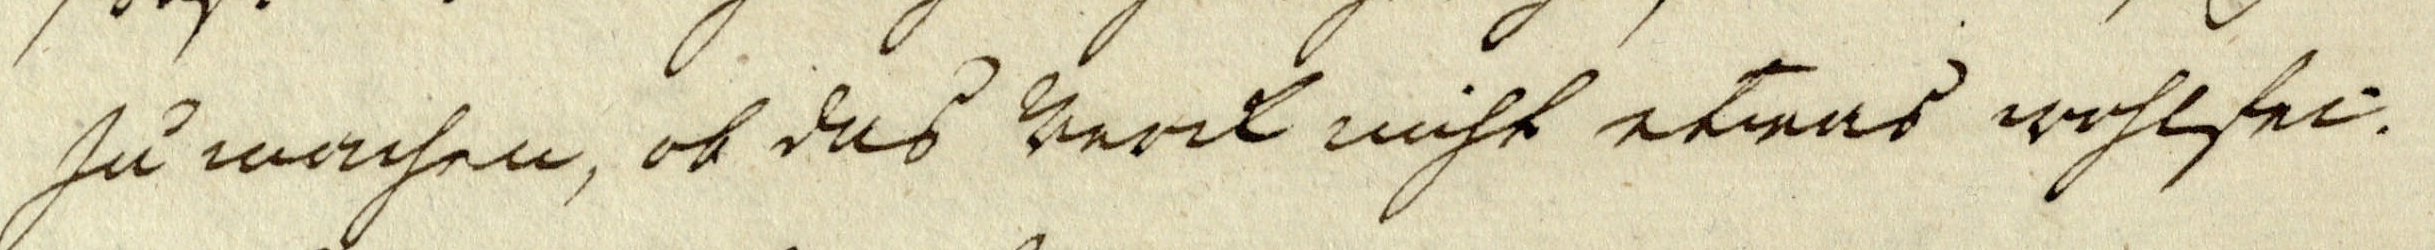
zu machen, ob das Werck nicht etwas wohlfei¬
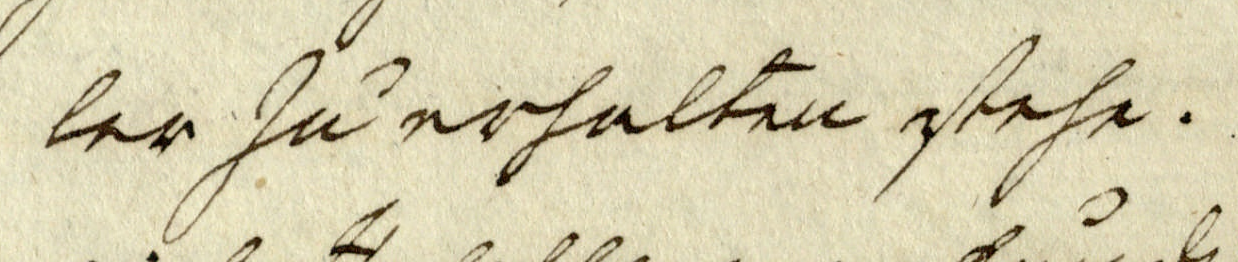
ler zu erhalten stehe.
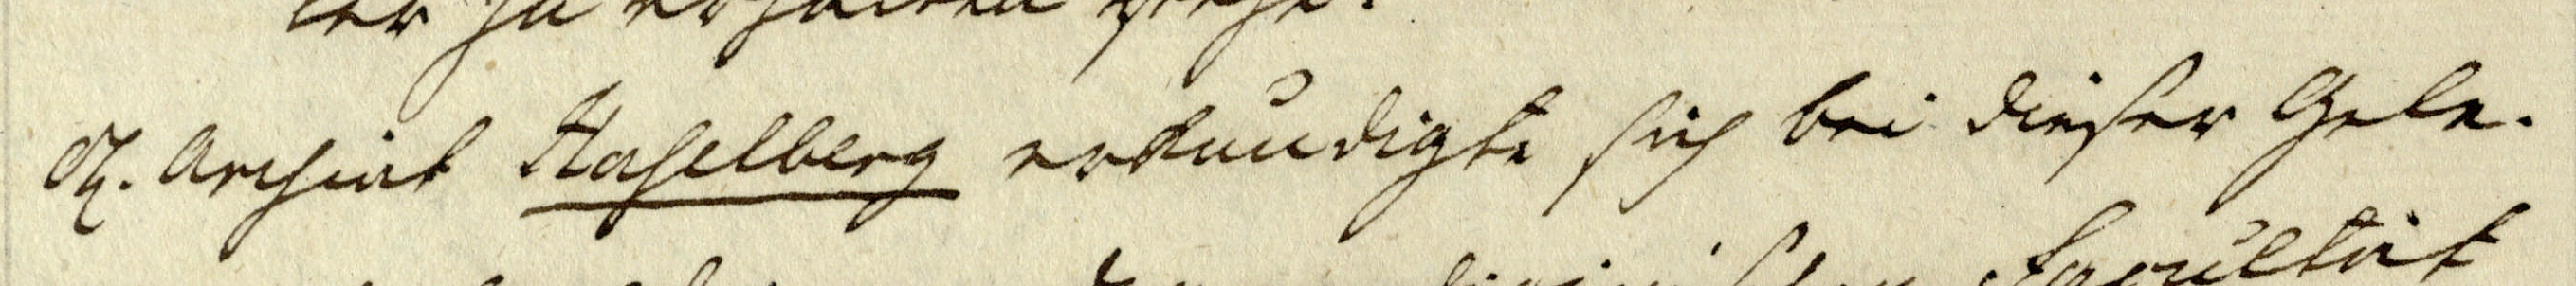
dh. Archiat. Haselberg erkundigte sich bei dieser Gele¬
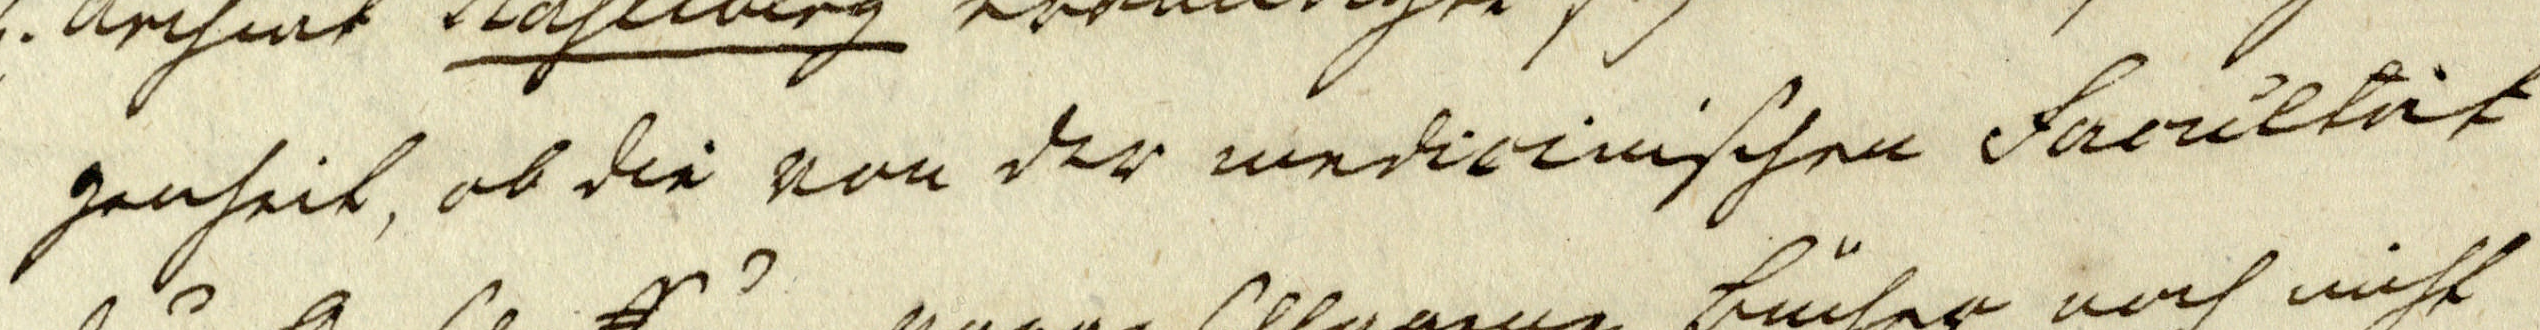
genheit, ob die von der medicinischen Facultät
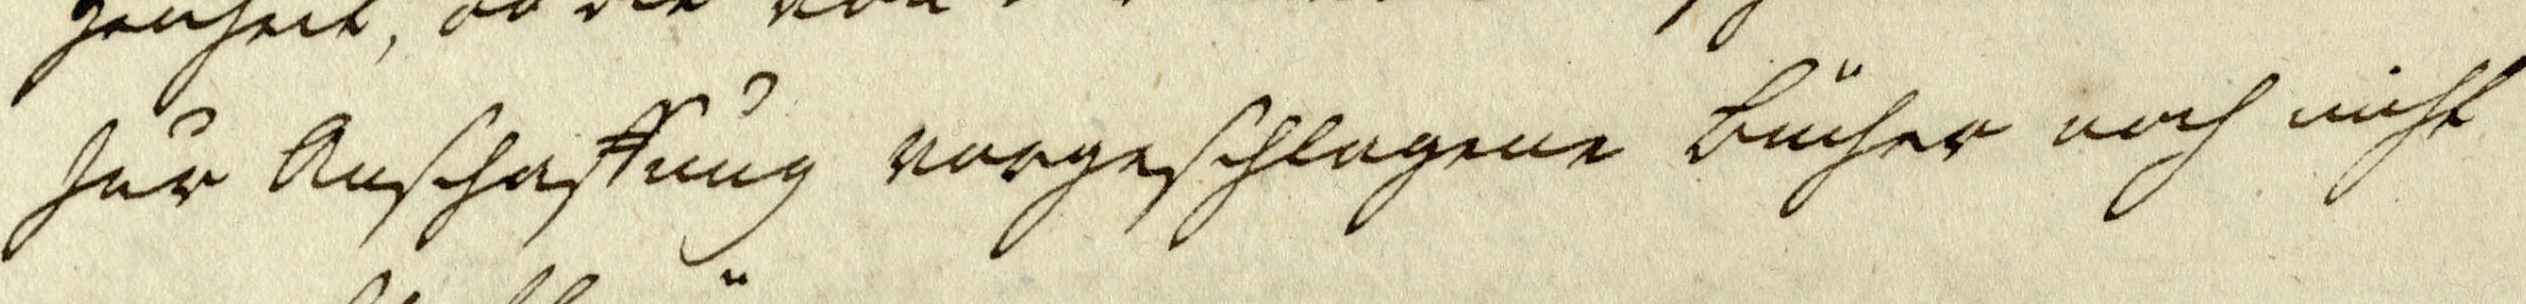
zur Anschaffung vorgeschlagene Bücher noch nicht
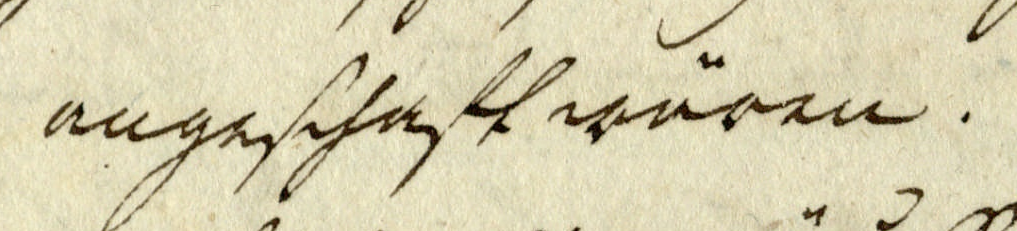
angeschaft wären.
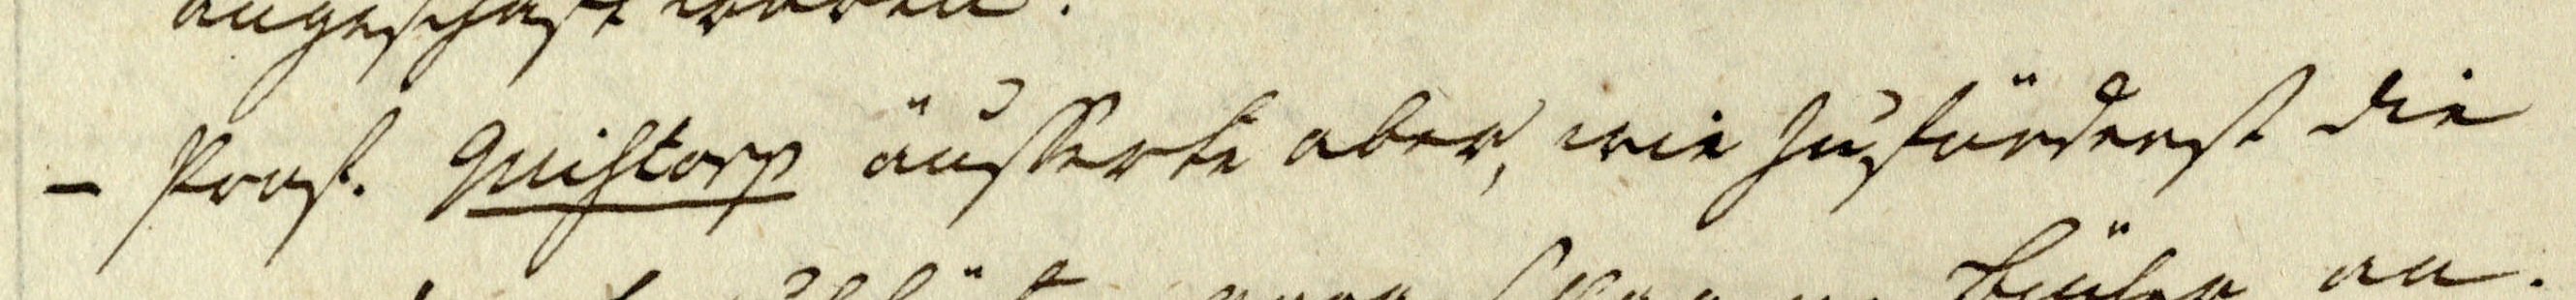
Prof. Quistorp äusserte aber, wie zuförderst die
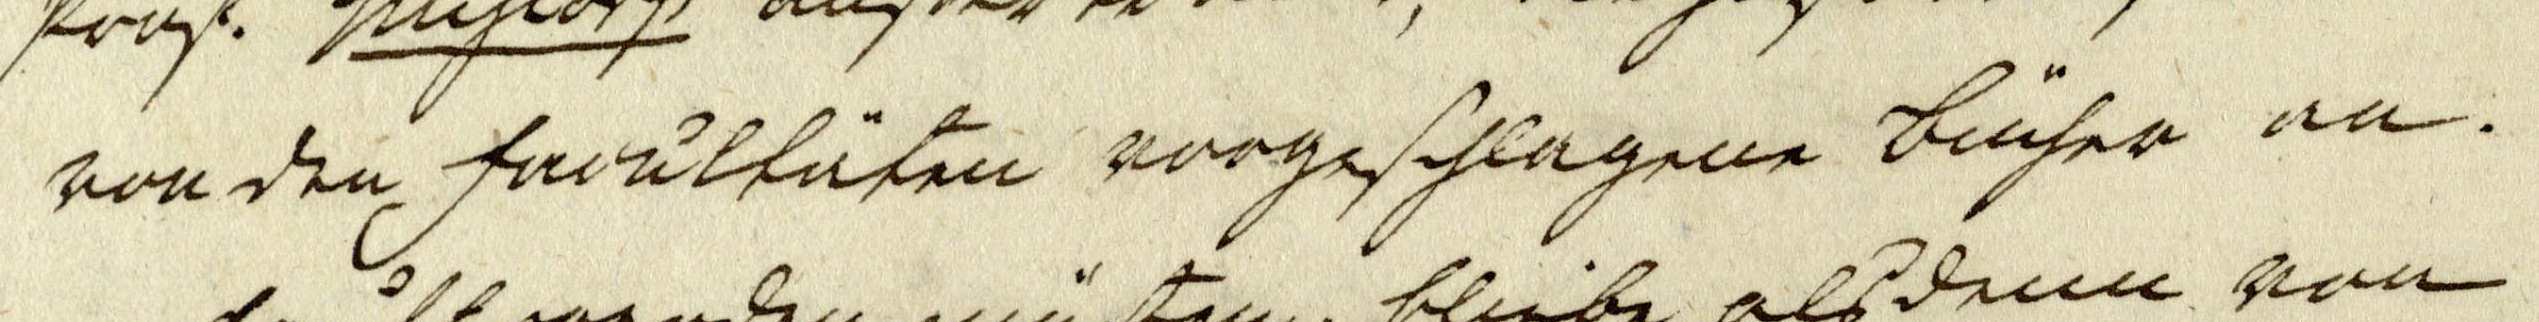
von den Facultäten vorgeschlagene Bücher an¬
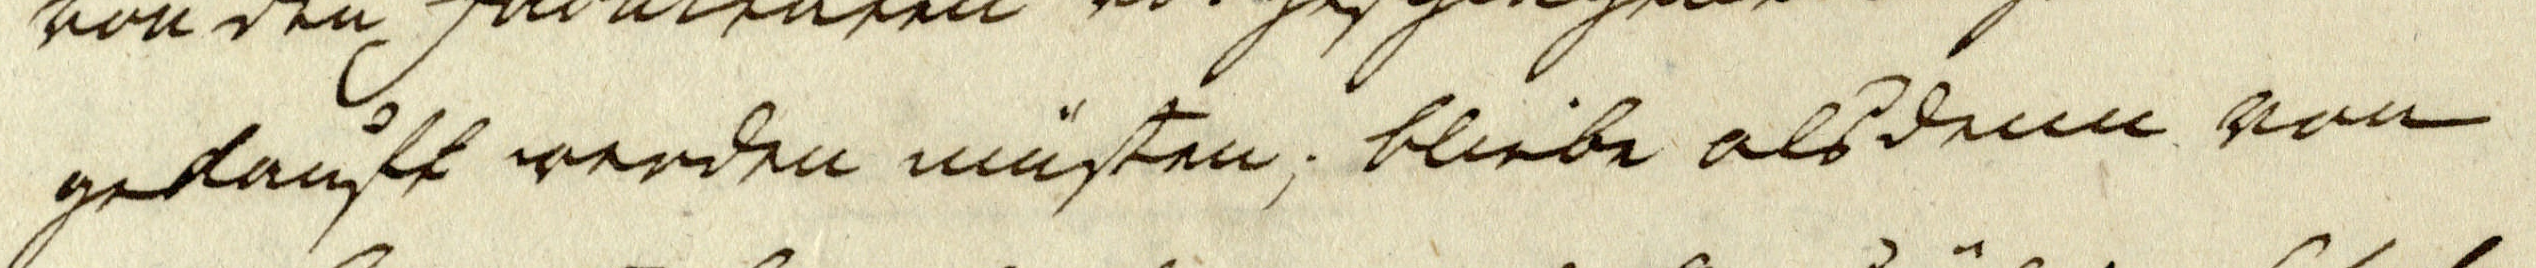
gekauft werden müßten; bliebe alsdenn von
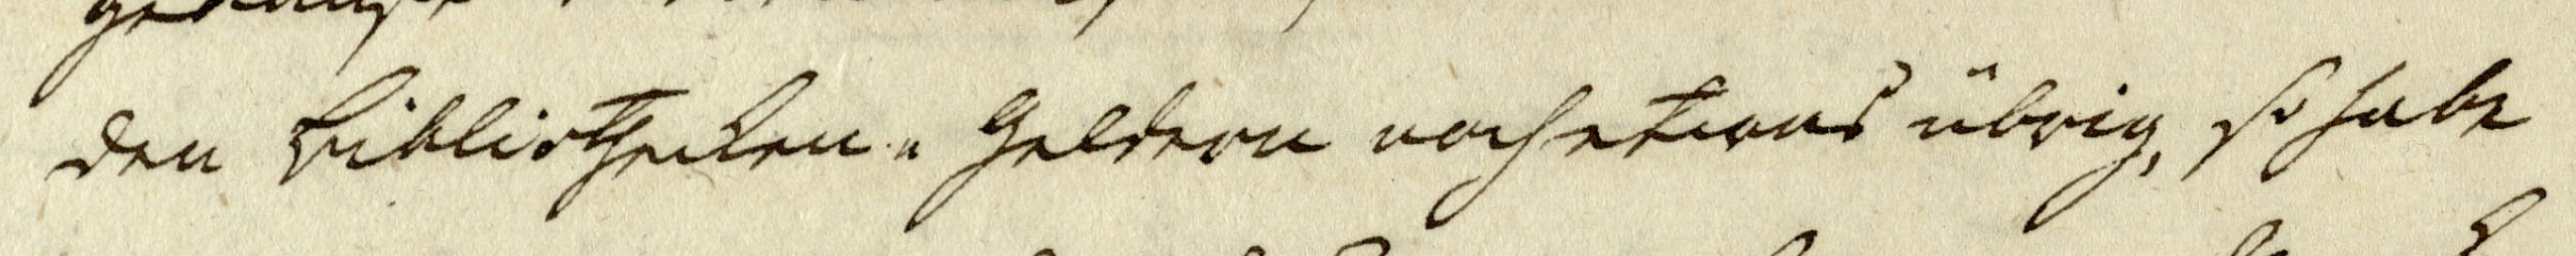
den Bibliothecken- Geldern nochetwas übrig, so habe
